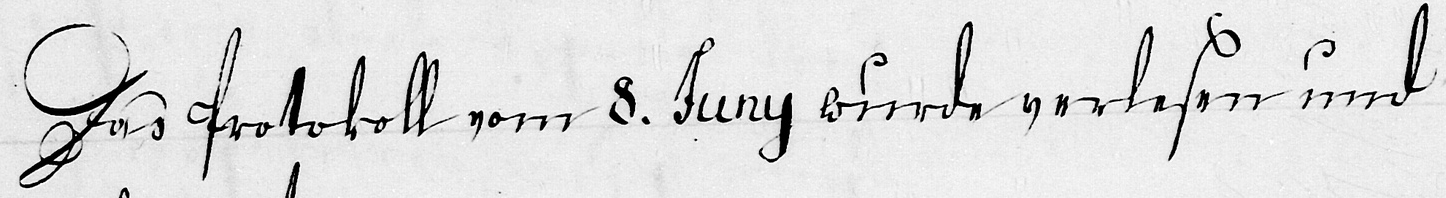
Das Protokoll vom 8. Juny wurde verlesen und
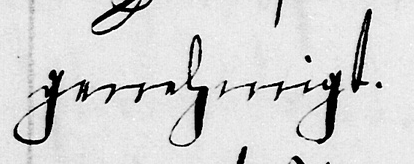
genehmigt.
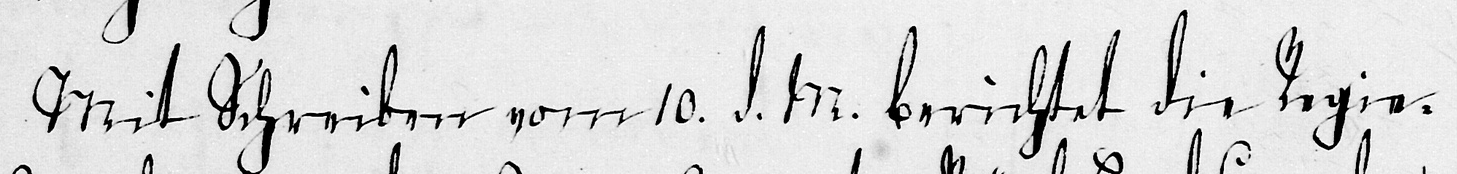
Mit Schreiben vom 10. d. M. berichtet die Regie¬
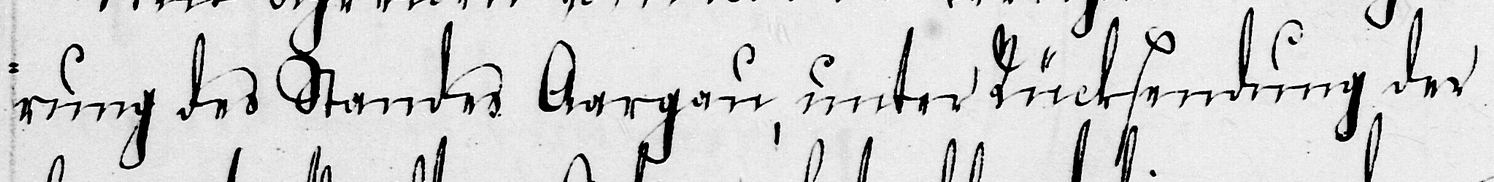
rung des Standes Aargau, unter Rücksendung der
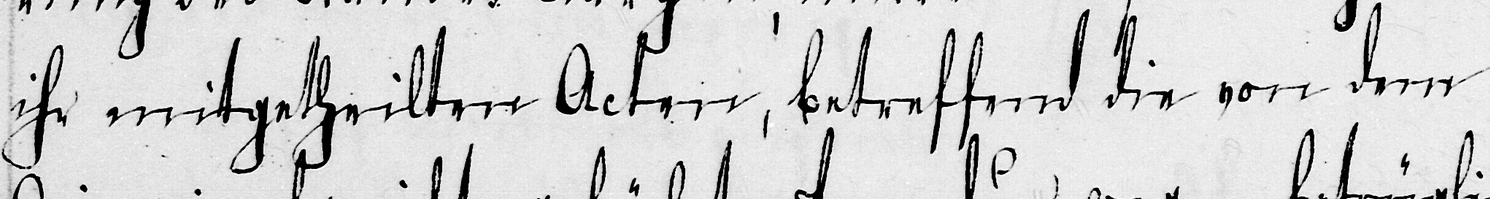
ihr mitgetheilten Acten, betreffend die von dem
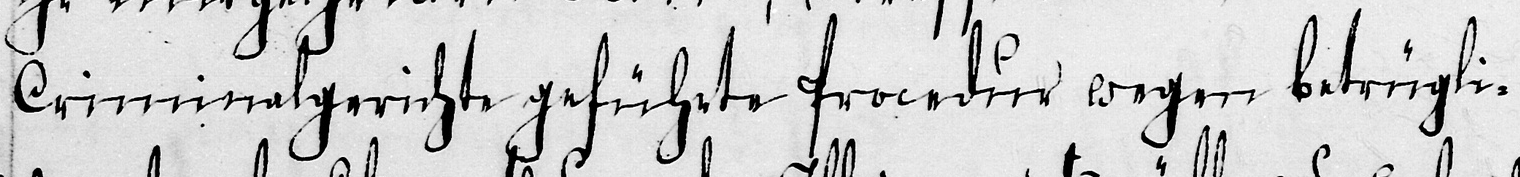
Criminalgerichte geführte Procedur wegen betrügli¬
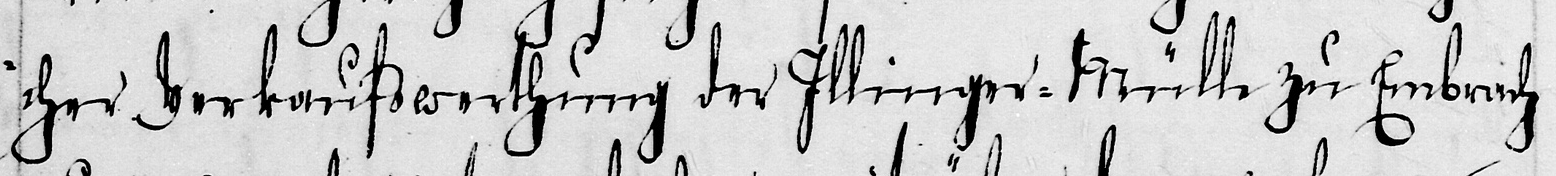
cher Verkaufswerthung der Illinger-Mülle zu Embrach
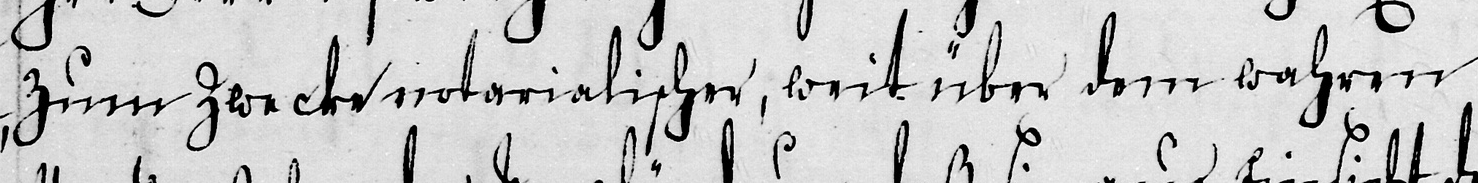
zum Zwecke notarialischer, weit über dem wahren
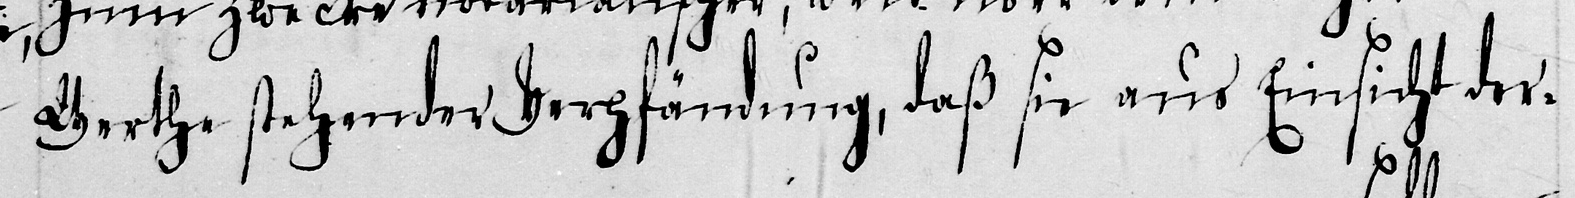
Werthe stehender Verpfändung, daß sie aus Einsicht der-
